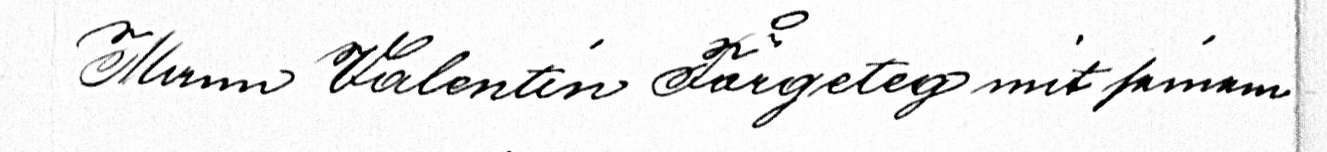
Mann Valentin Förgeteg mit seinem
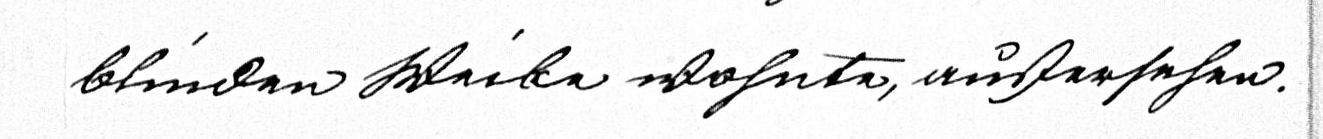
blinden Weibe wohnte, ausersehen.
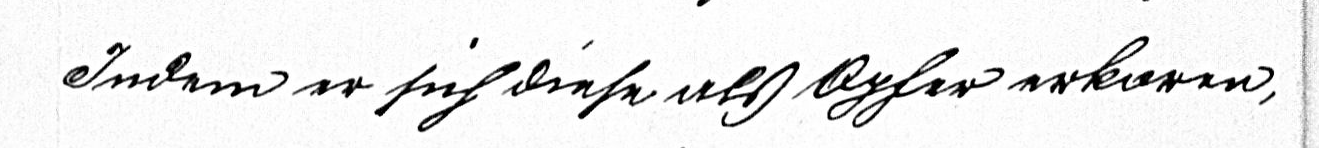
Indem er sich diese als Oyfer erkoren,
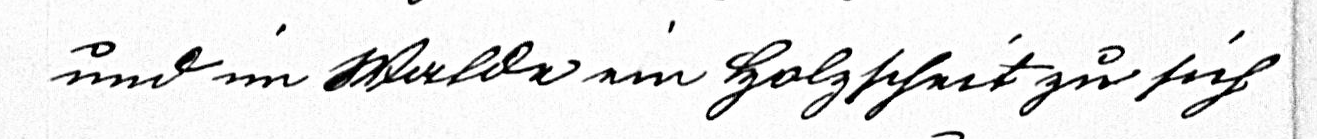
und im Walde im Holzscheit zu sich
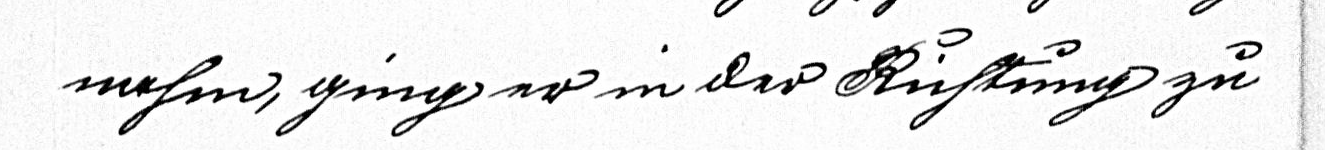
nahm, ging er in der Richtung zu
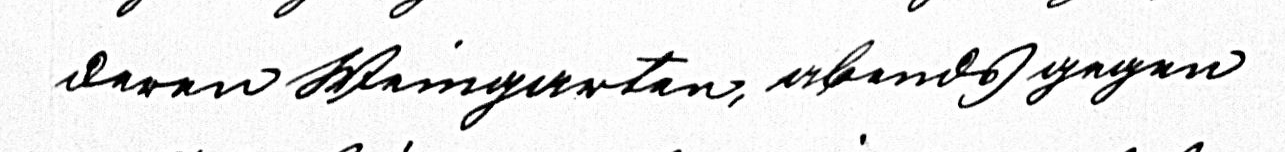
deren Weingarten, abends gegen
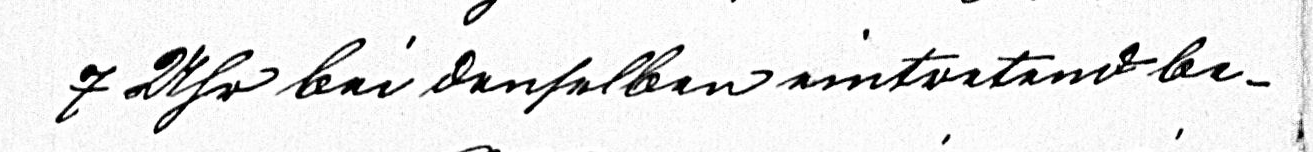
7 Uhr bei denselben eintretend be¬
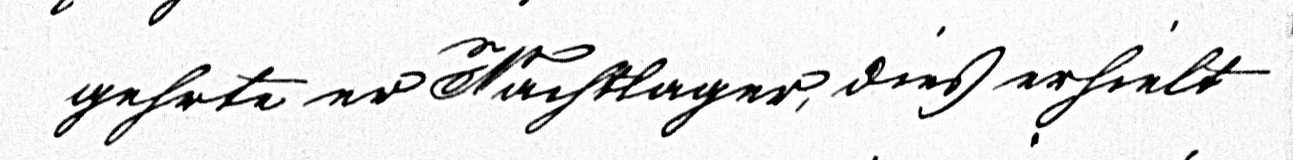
gehrte er Nachtlager, dies erhielt
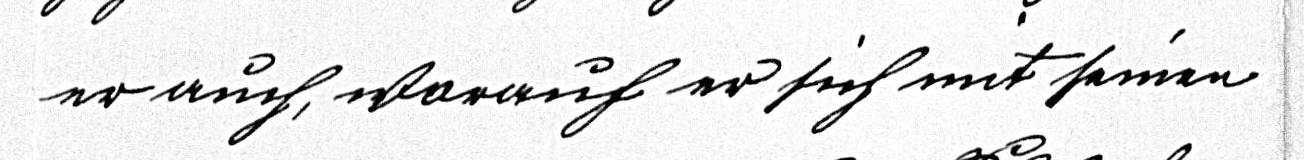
er auch, worauf er sich mit seinen
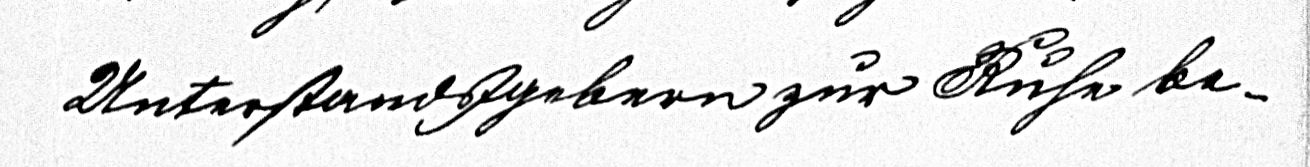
Unterstandsgebern zur Ruhe be¬
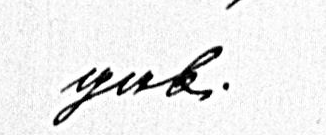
gab.
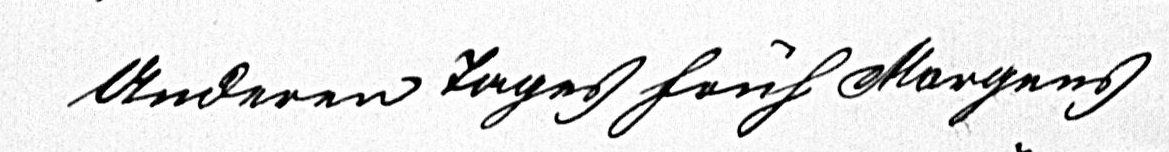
Anderen Tages früh Morgens
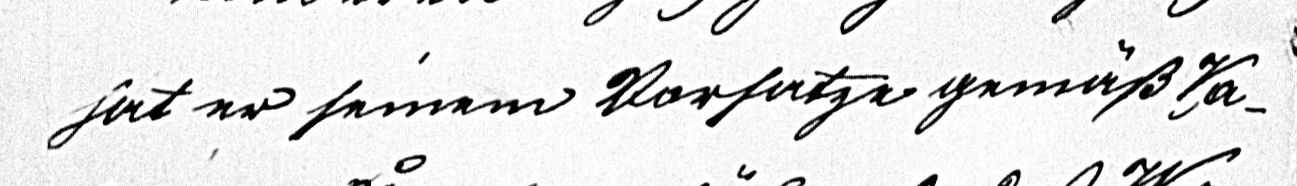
hat er seinem Vorsatze gemäß Va¬
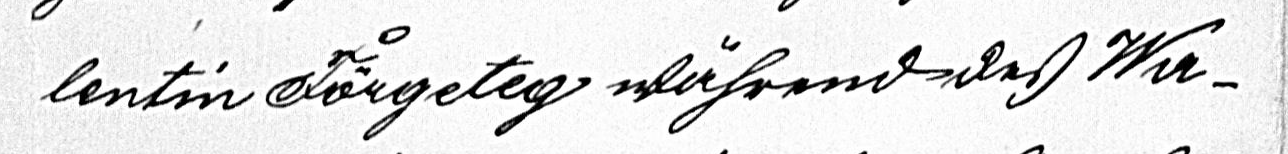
lentin Förgeteg während des Wa¬
